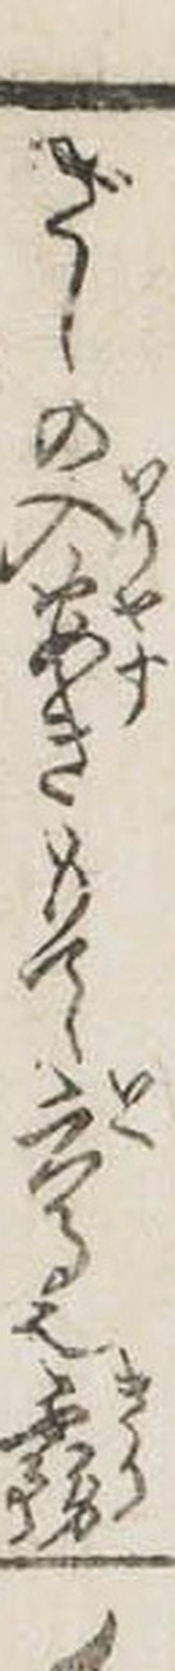ざしの入安きもて云る也霧
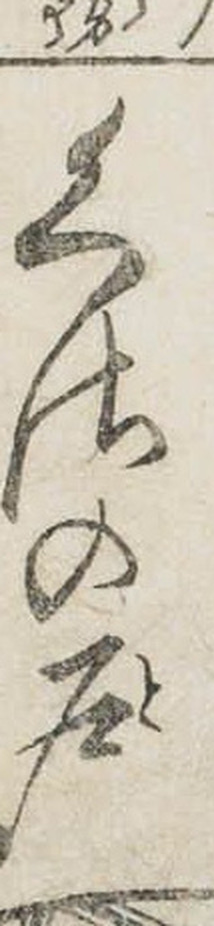くさの戸
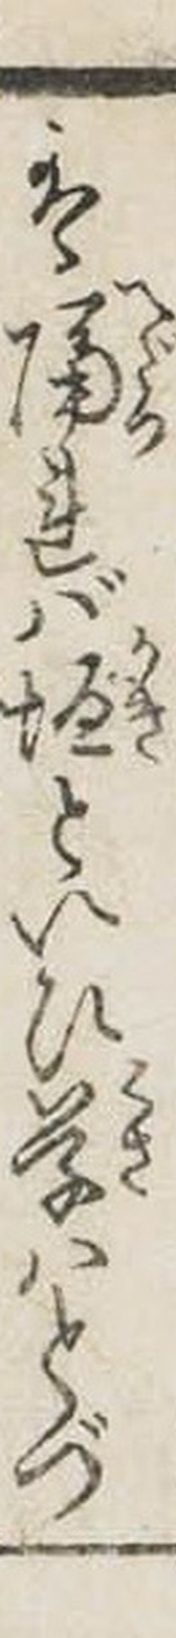は隔れば垣といひ草はとづ
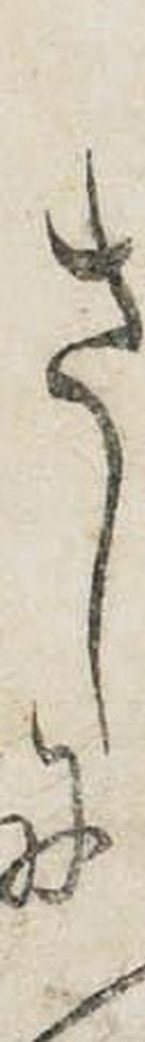ざしに
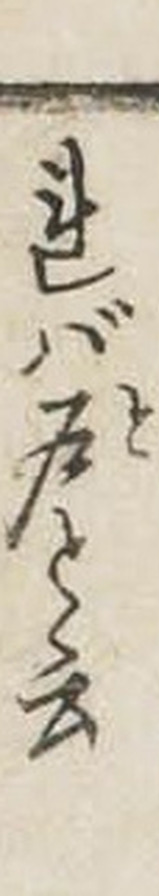れば戸と云
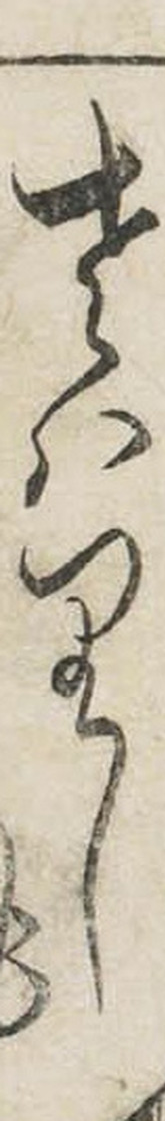さはりしも

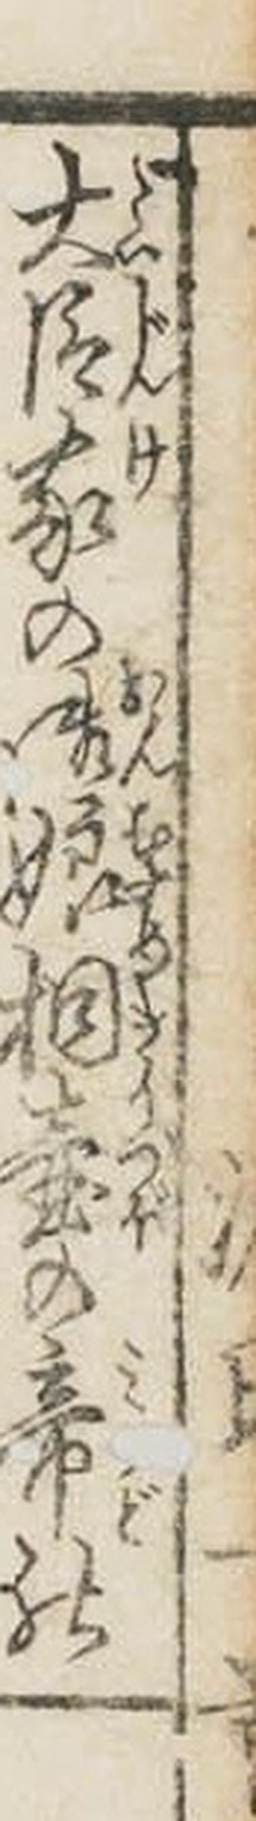大臣家の御娘桐壺の帝の
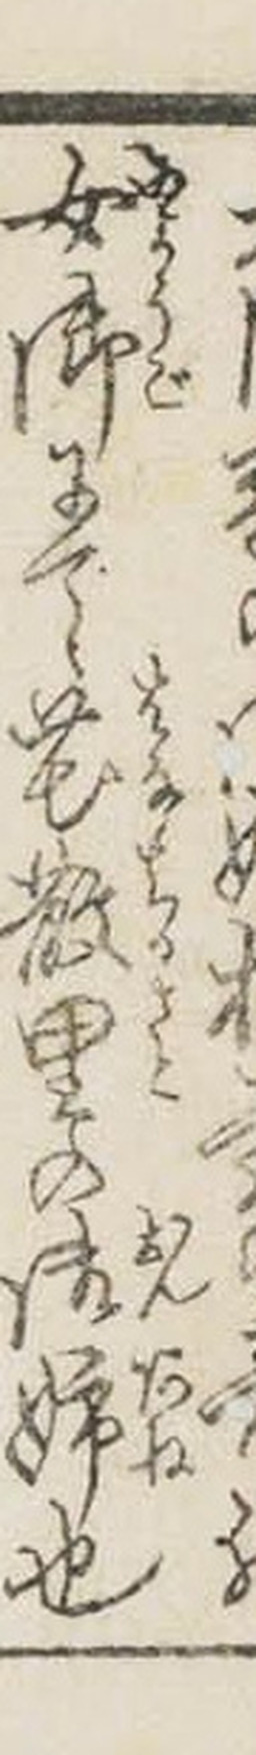女御にて花散里の御姉也
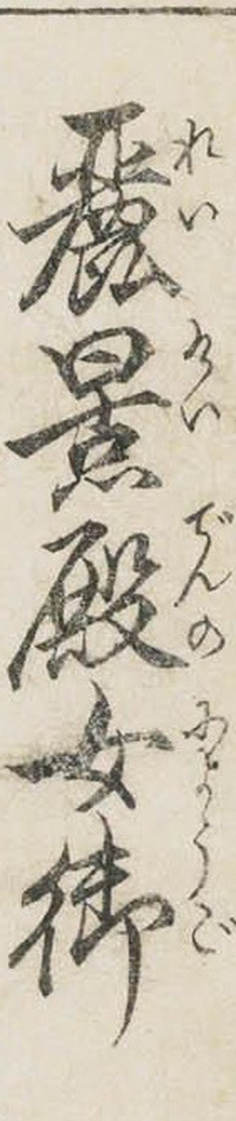麗景殿女御
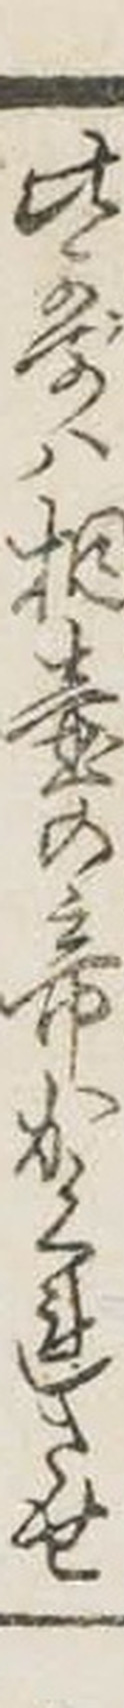此哥は桐壺の帝かくれさせ
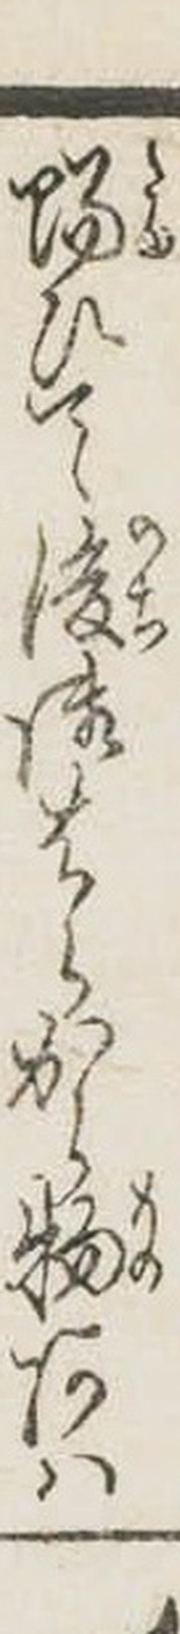賜ひて後御はらから物あは
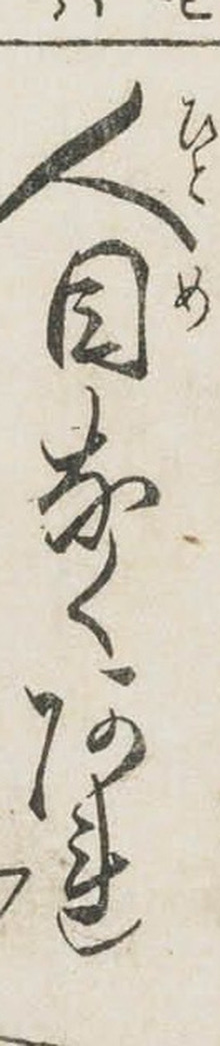人目なくあれ
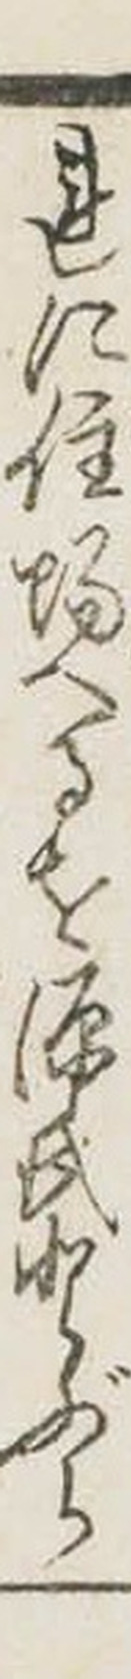れに住賜へるを源氏とぶら
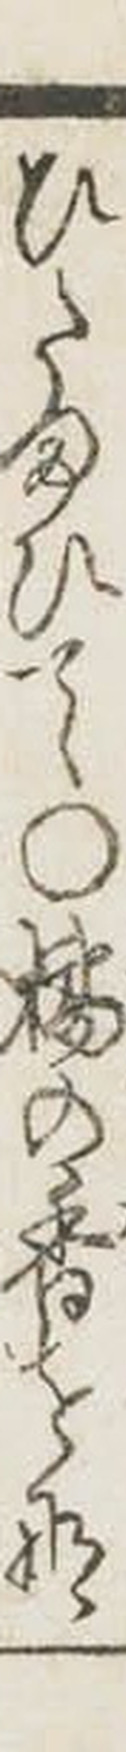ひたまひて○橘の香をな
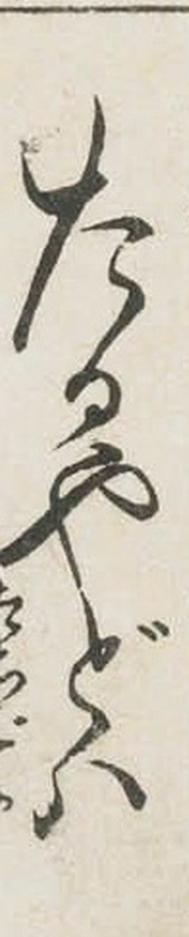たるやどは
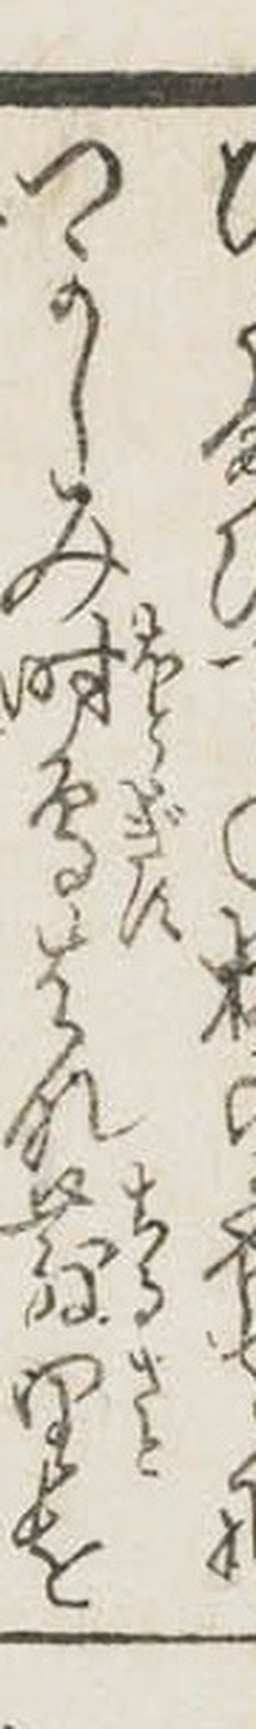つかしみ時鳥はな散里を
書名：源氏百人一首
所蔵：東京学芸大学教育コンテンツアーカイブ
